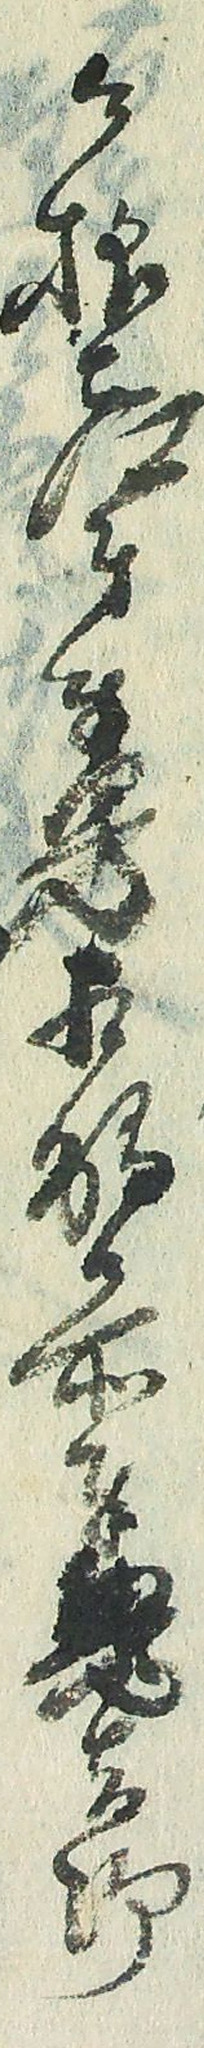候様被仰付奉畏相触候所奉畏旨御
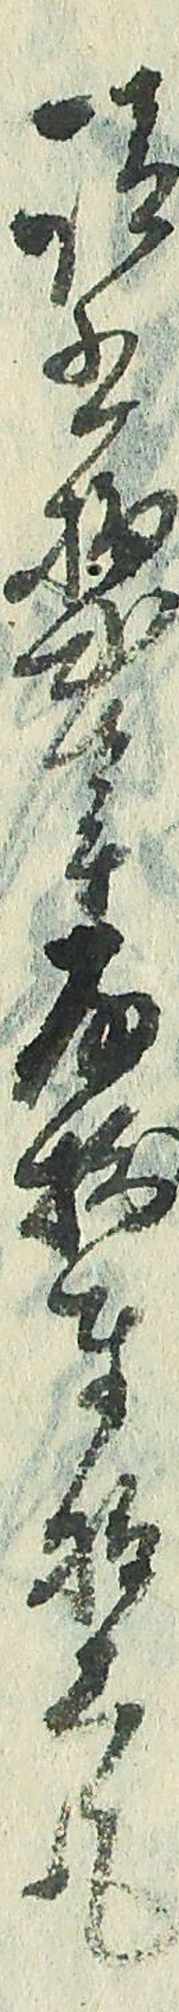請書指出候に付取揃奉指上候以上
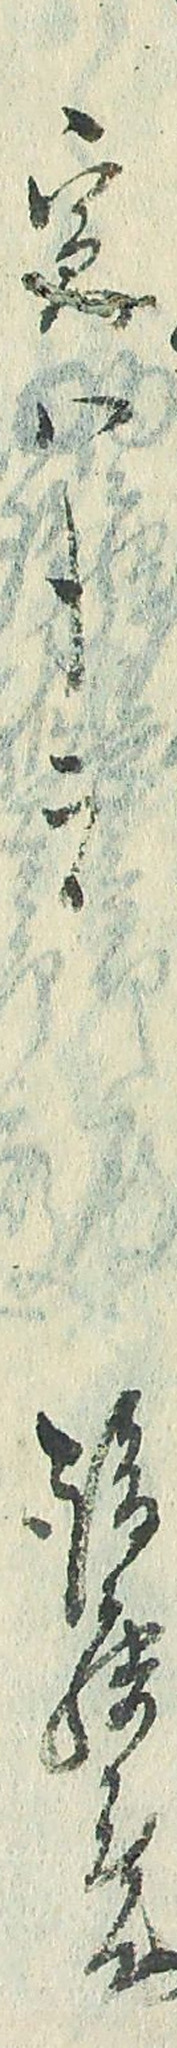寅八月二日後藤庄助

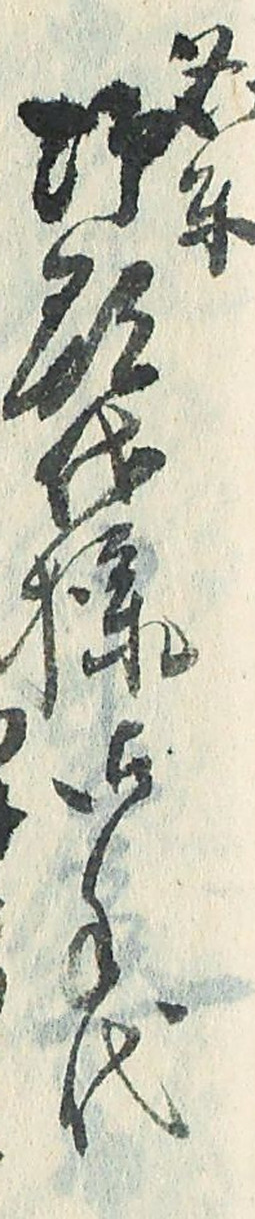御郡代様御手代
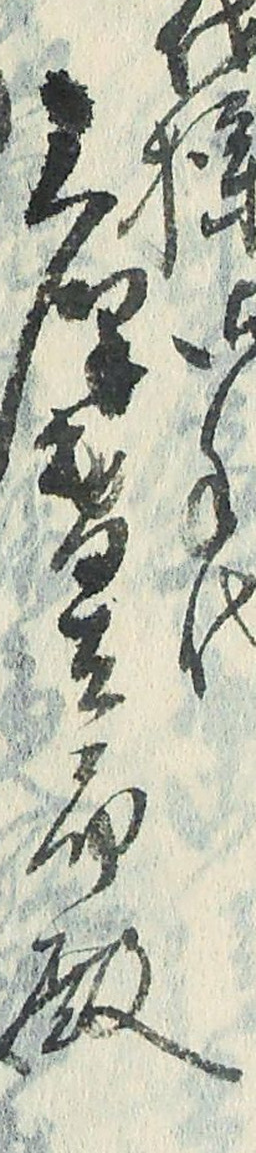三沢春太郎殿
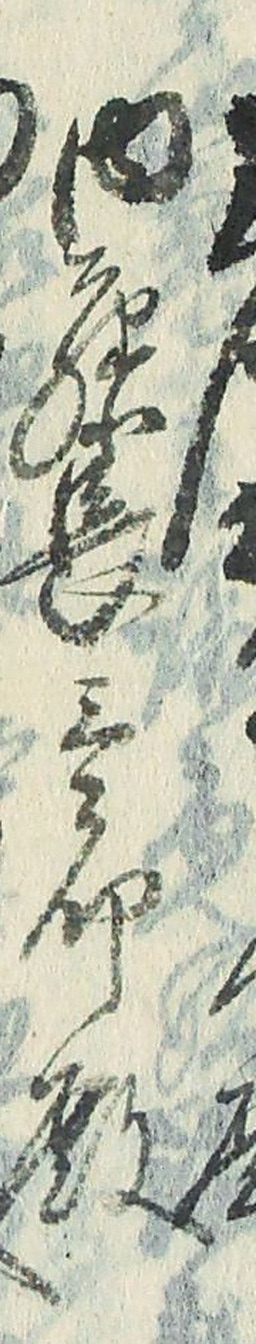内藤長三郎殿
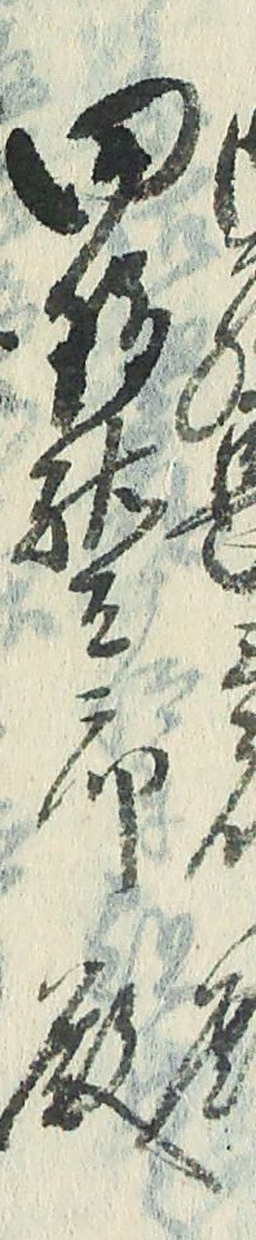田野祐太郎殿
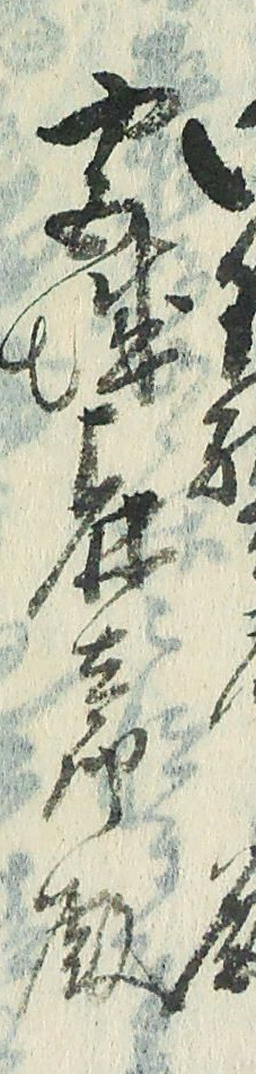宮城麻太郎殿
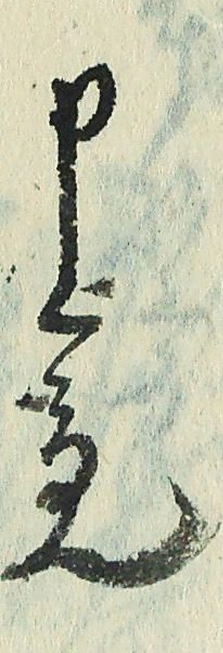申上覚
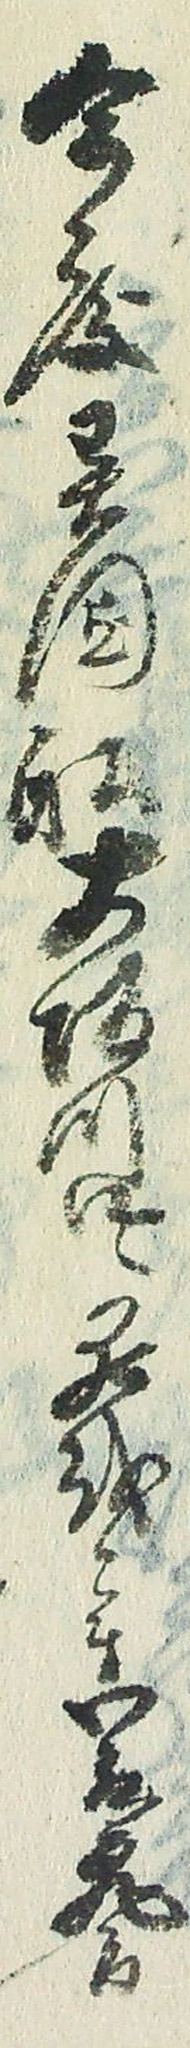今度異国船大坂川口へ罷越候に付き御取究方
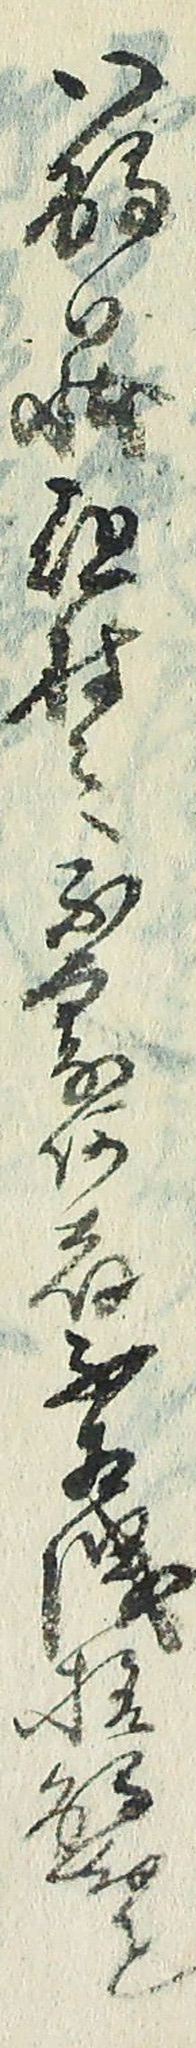御触御状組村々へ不寄何者不相洩様触知せ
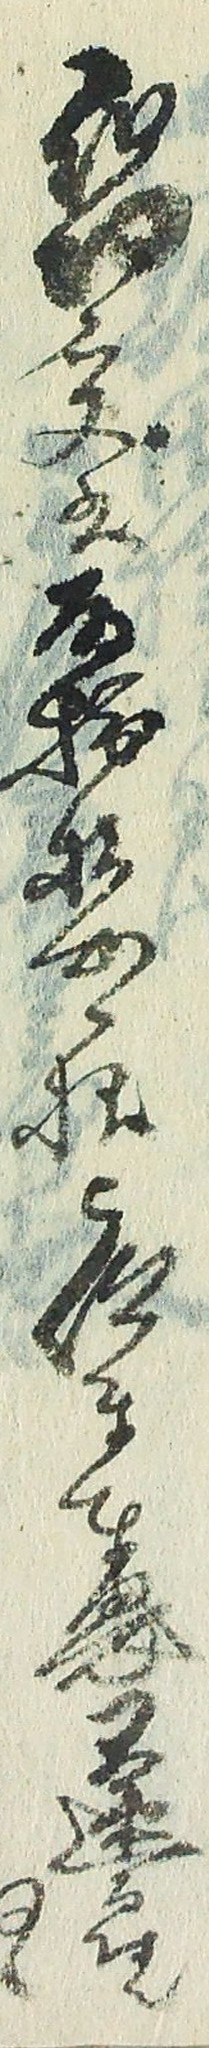組切受書取揃指出候様被仰付奉畏早速与村々
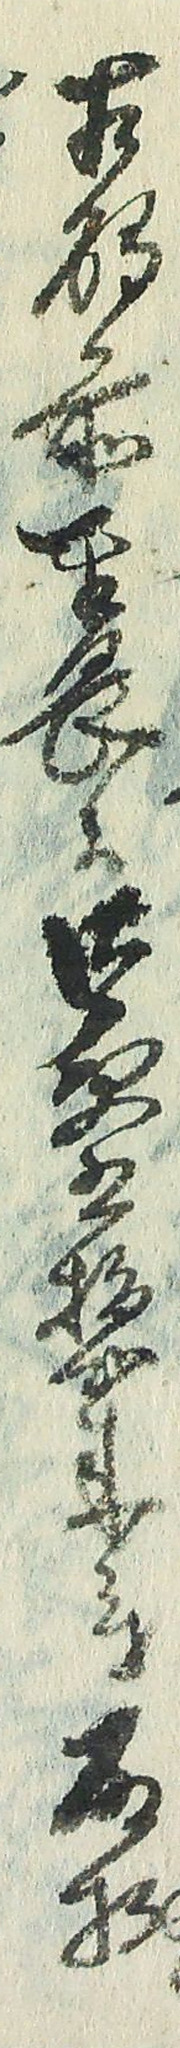相触候所奉畏旨御受書指出来に付取揃へ
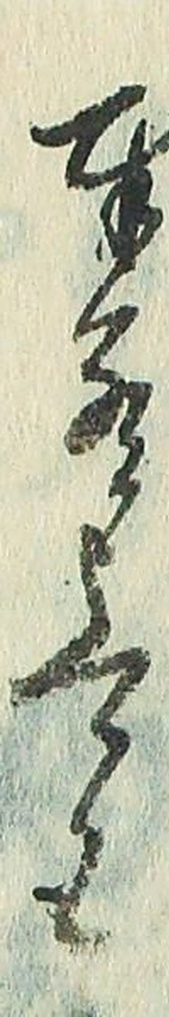奉差上候以上
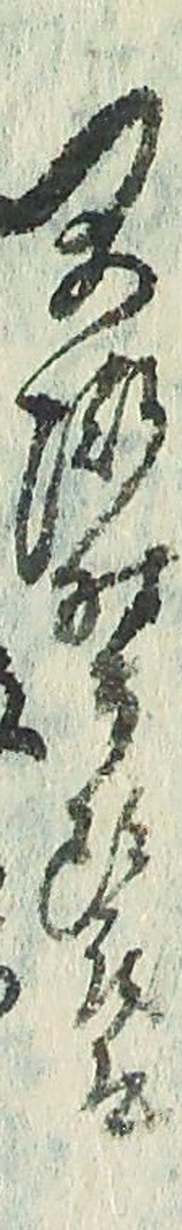早淵村与頭庄屋
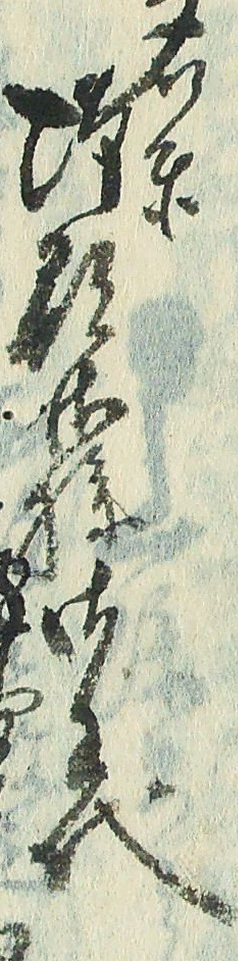御郡代様御手代
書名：諸御用御□受書控
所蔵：鳴門教育大学 Naruto University of Education
